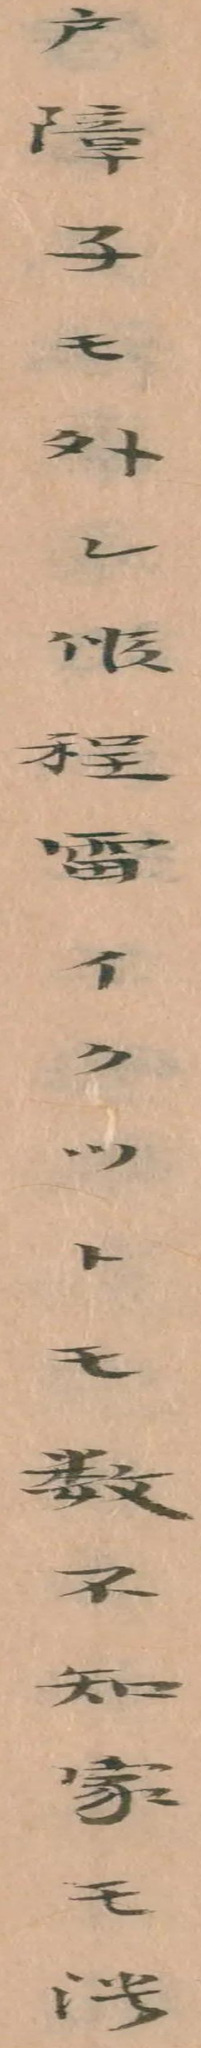戸障子モ外レ候程雷イクツトモ数不知家モ潰
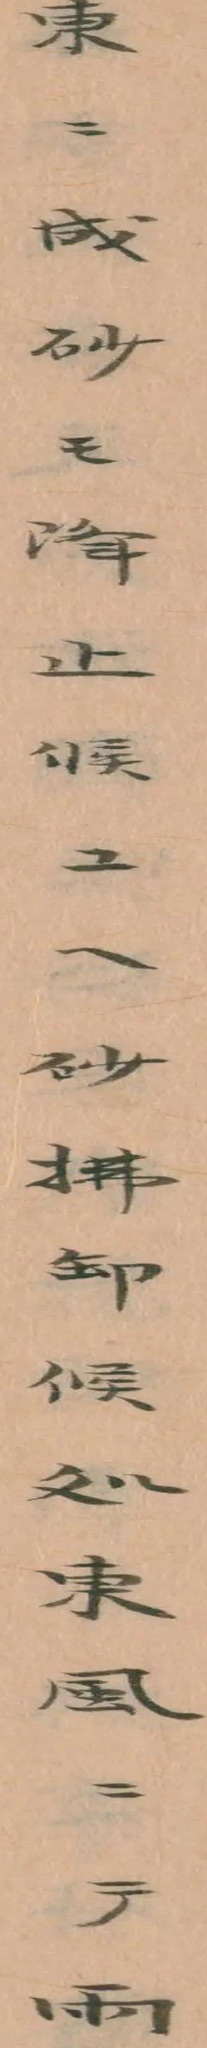東二成砂モ降止候ユヘ砂払卸候処東風ニテ雨
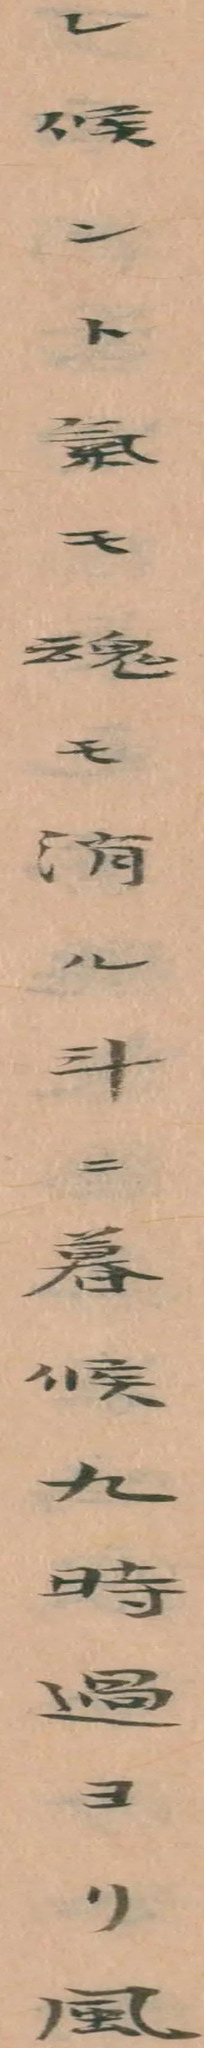レ候ント気モ魂モ消ル斗二暮候九時過ヨリ風
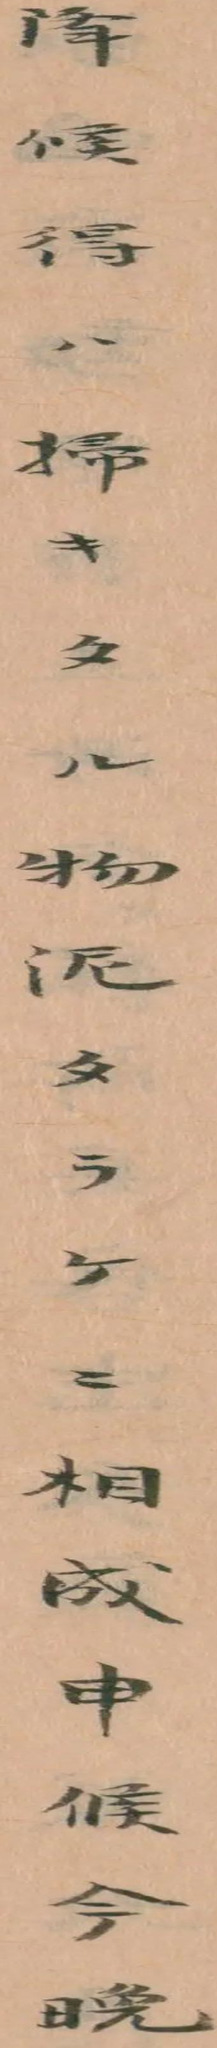降候得ハ掃キタル物泥タラケ二相成申候今晩
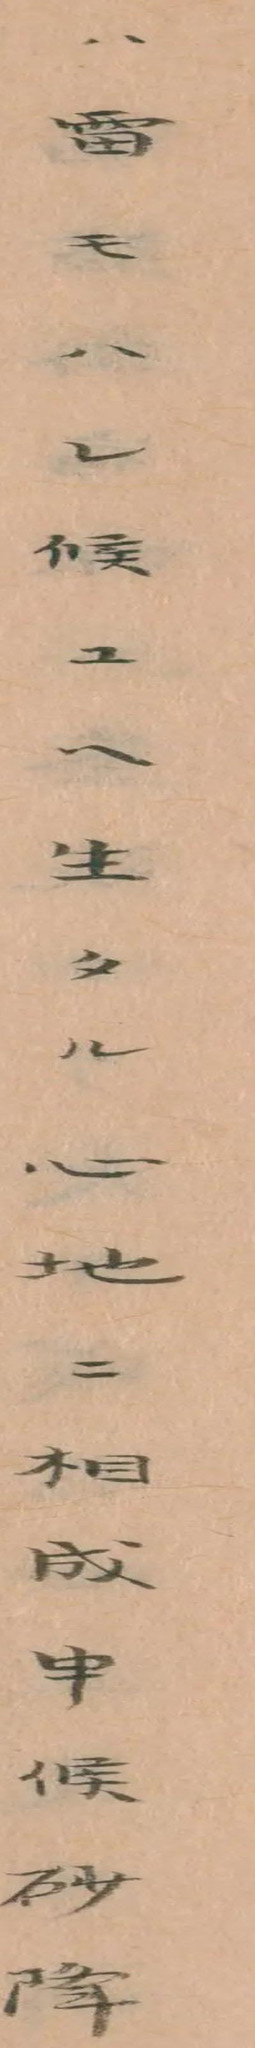ハ雷モハレ候ユヘ生タル心地二相成申候砂降
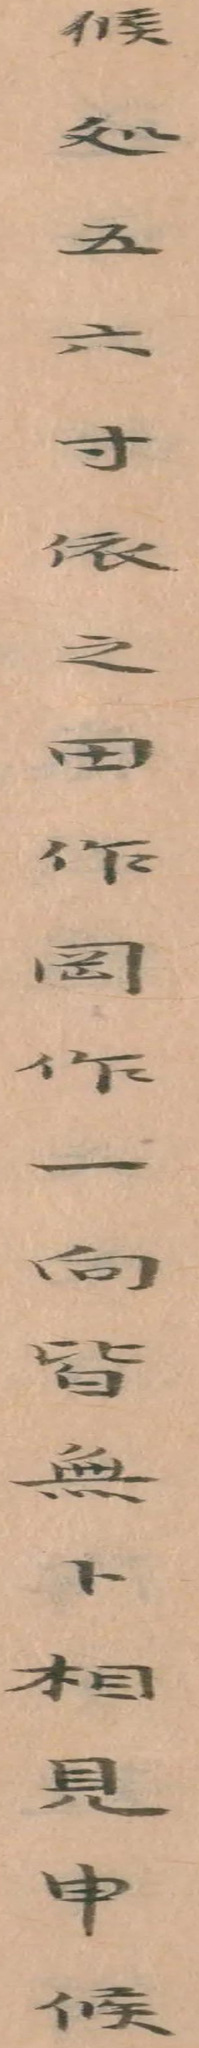候処五六寸依之田作岡作一向皆無ト相見申候
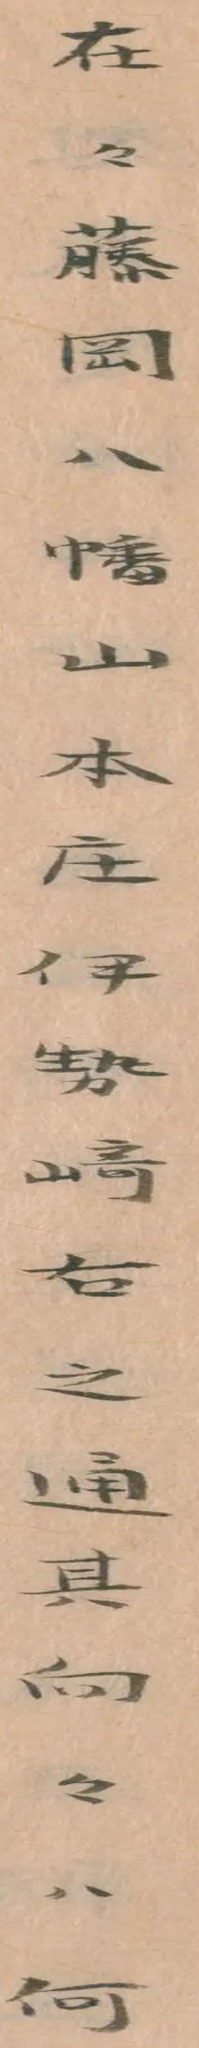在々藤岡八幡山本庄伊勢崎右之通其向々ハ何
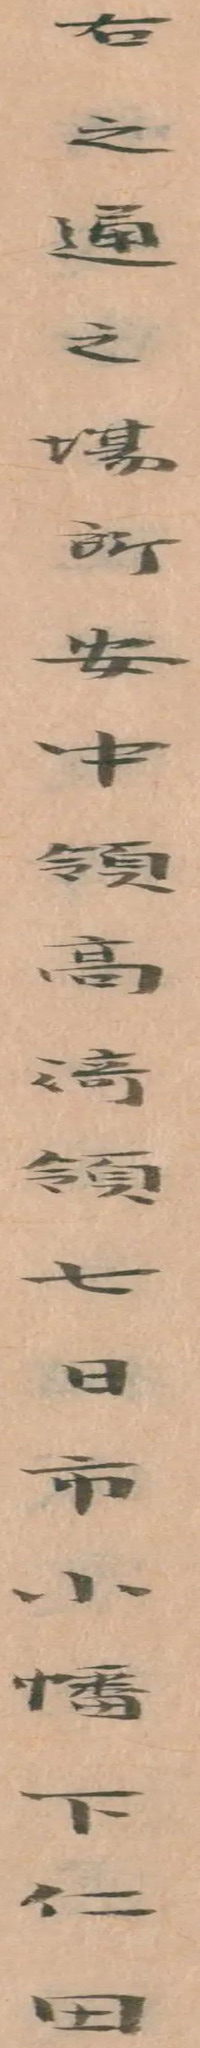右之通之場所安中領高崎領七日市小幡下仁田
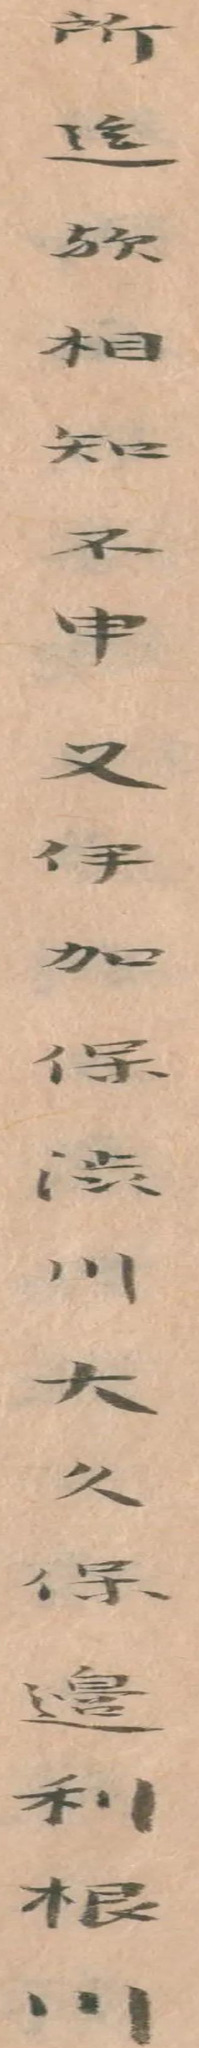所迄歟相知不申又伊香保渋川大久保辺利根川
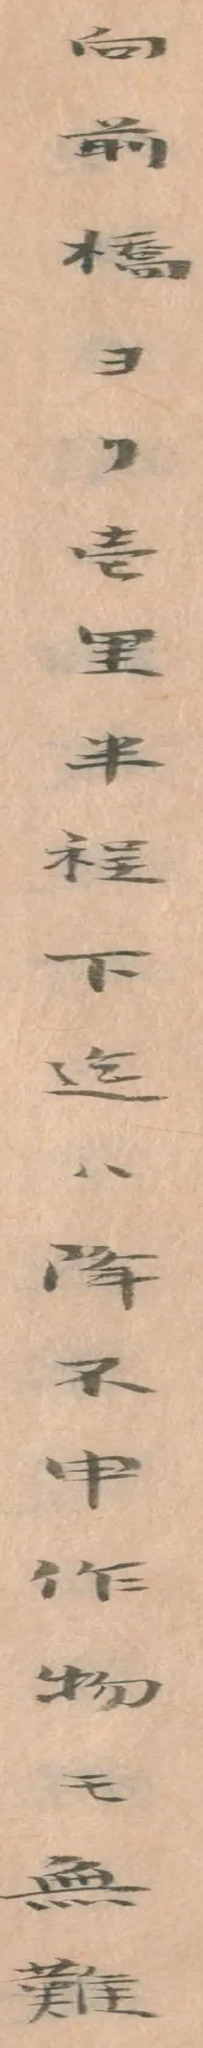向前橋ヨリ壱里半程下迄ハ降不申作物モ無難
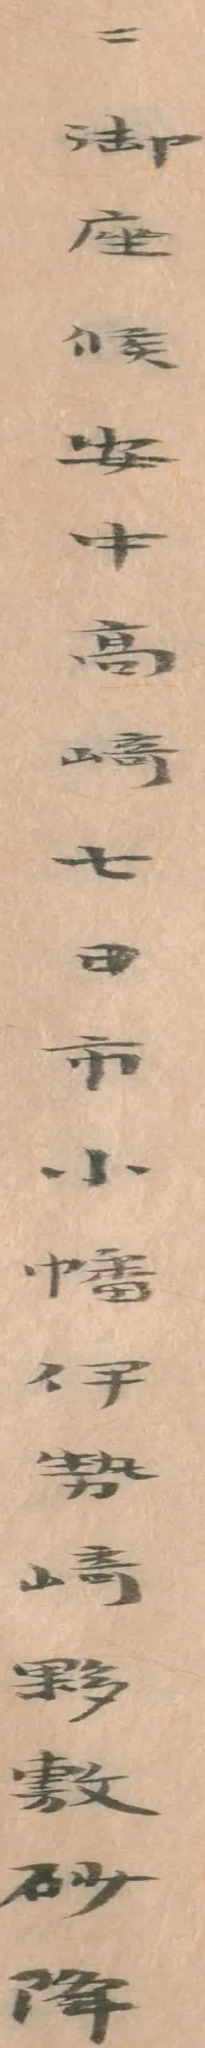二御座候安中高崎七日市小幡伊勢崎夥敷砂降
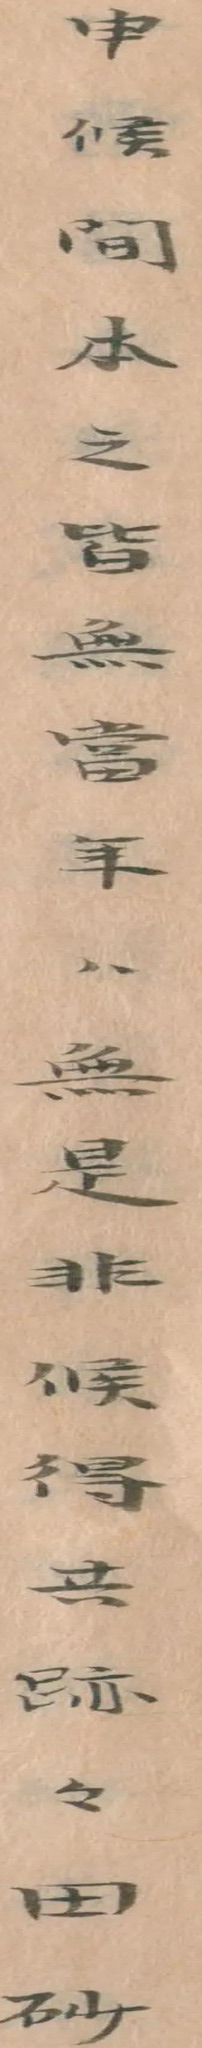申候間本之皆無当年ハ無是非候得共跡々田砂
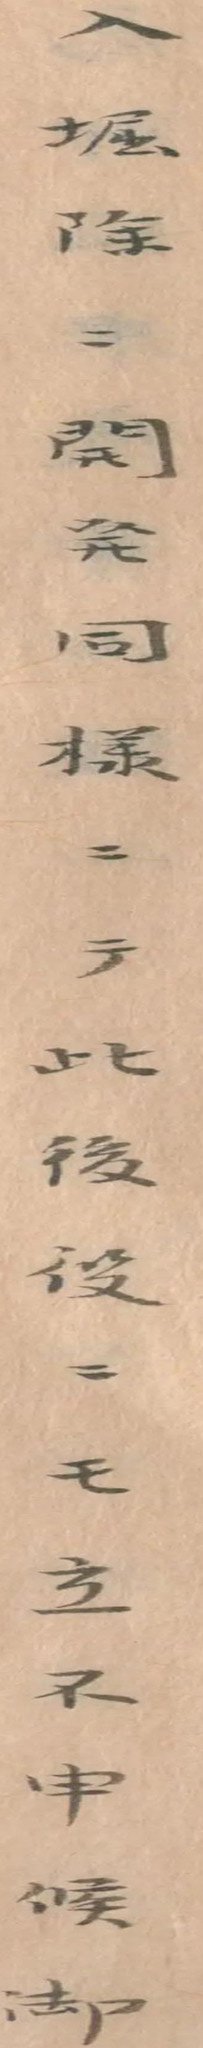居堀除二開発同様二テ此後役ニモ立不申候御
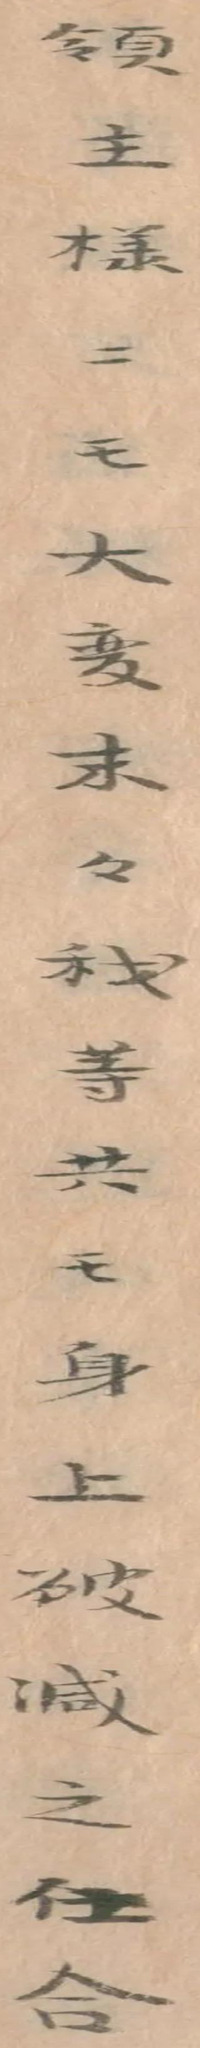領主様ニモ大変未々我等共モ身上破滅之仕合

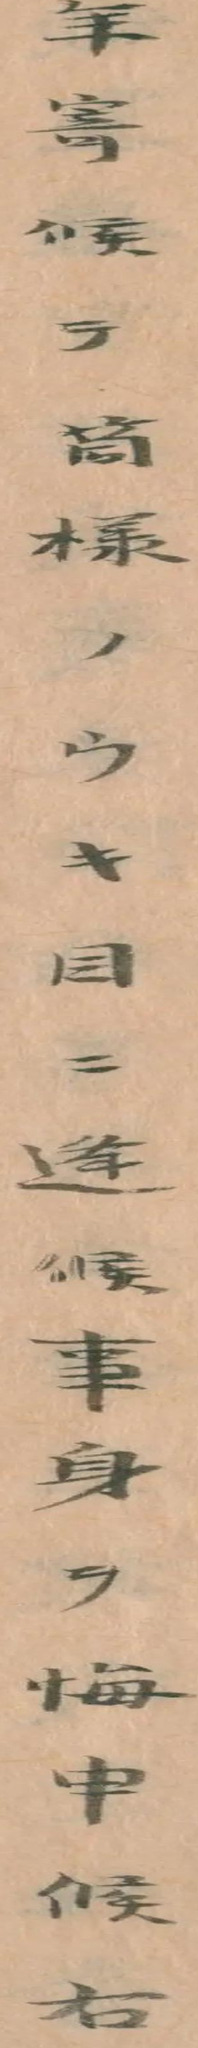年寄候テ筒様ノウキ目二逢候事身ヲ悔申候右
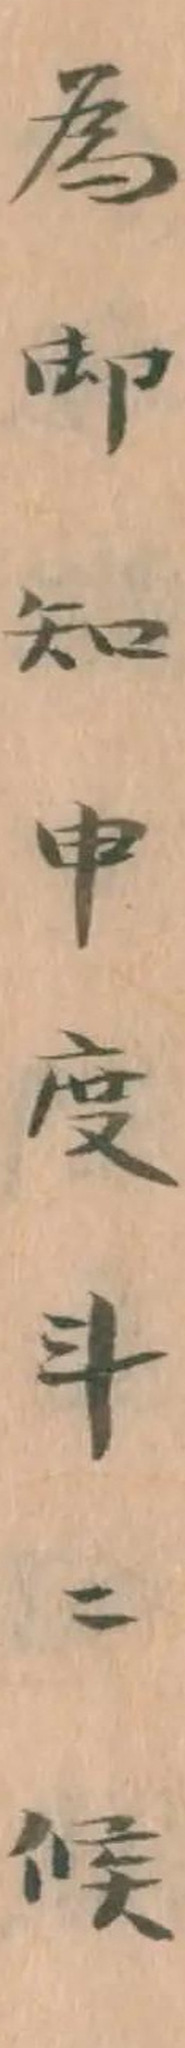為御知申度斗二候
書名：地災撮要. 巻1(噴火山・地震ノ部)
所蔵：国立国会図書館 National Diet Library, JAPAN
